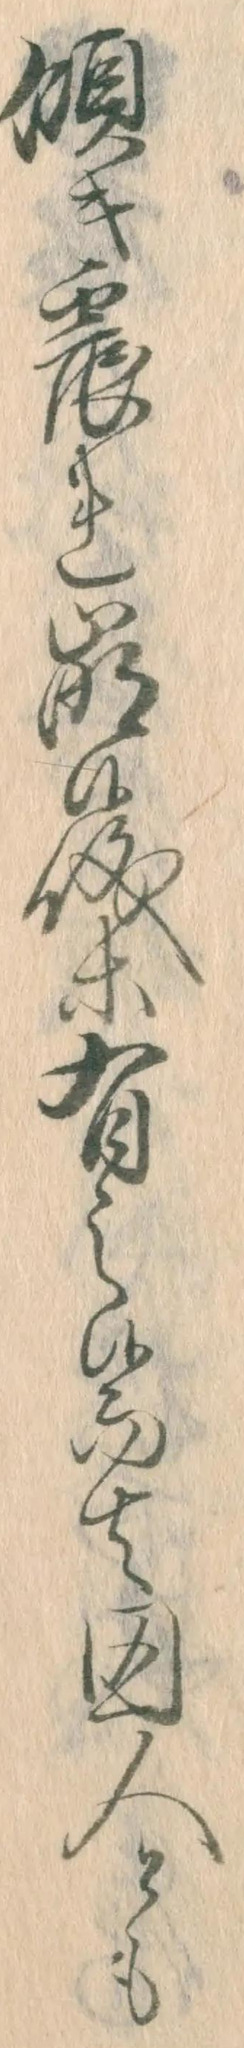傾キ震れ崩候儀等有之候ては囚人とも
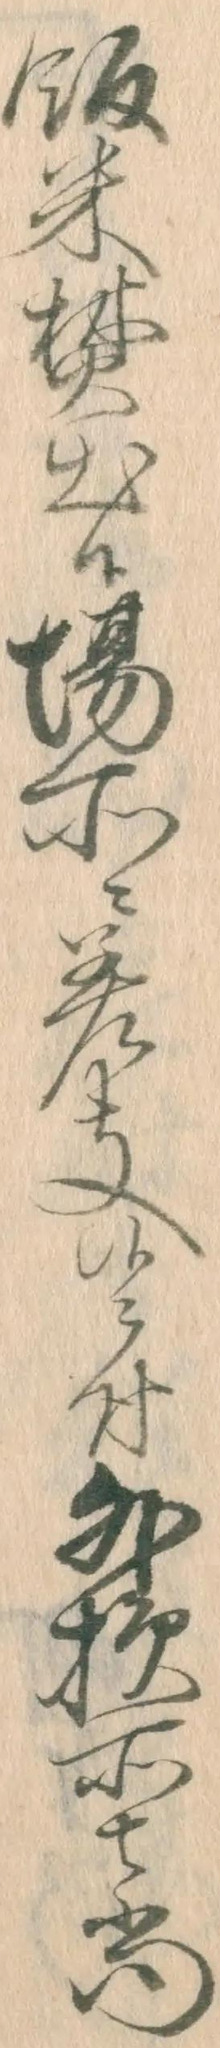飯米焚出候場所ニ差支候ニ付外損所は尚
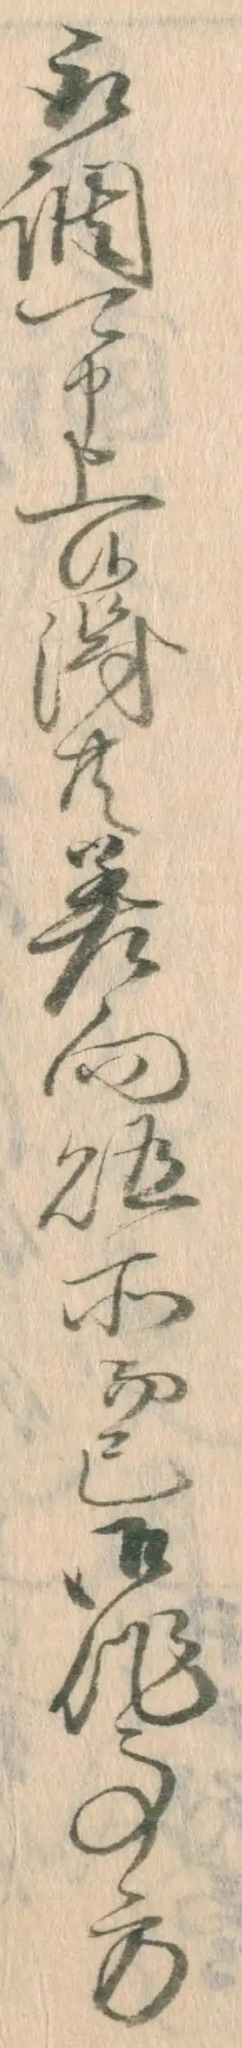取調可申上候得共差向賄所而已御作事方
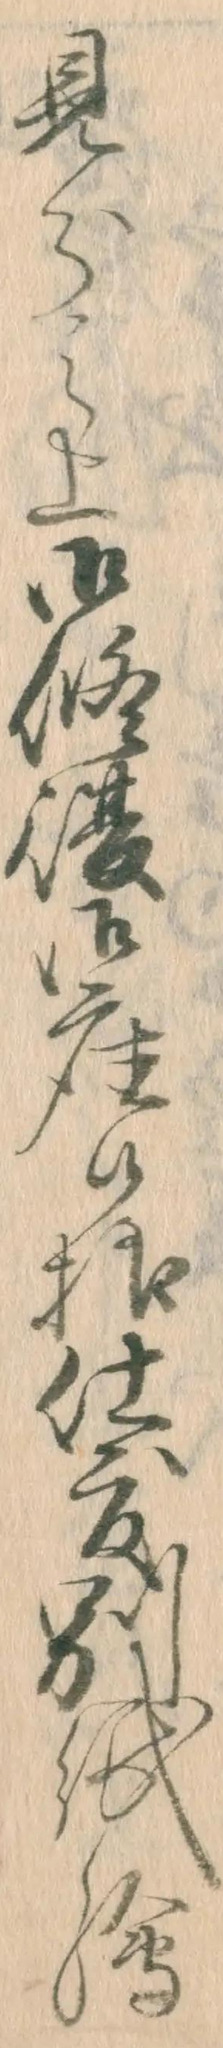見分之上御修復御座候様仕度別紙絵
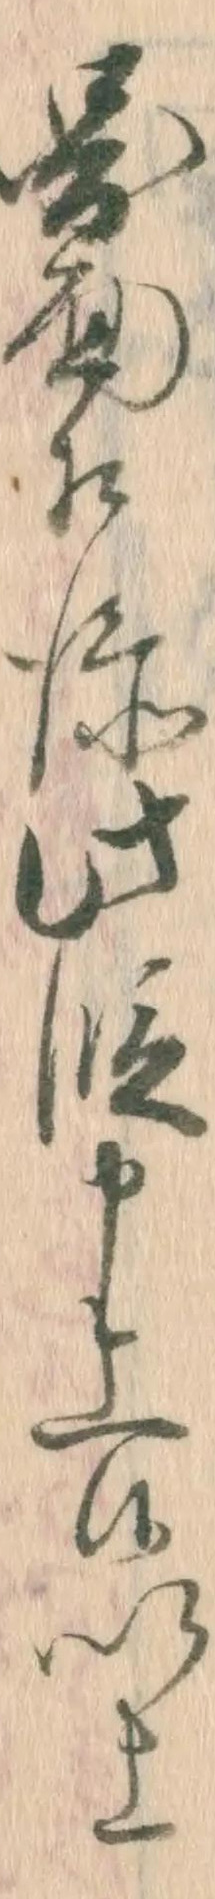図面相添此段申上候以上
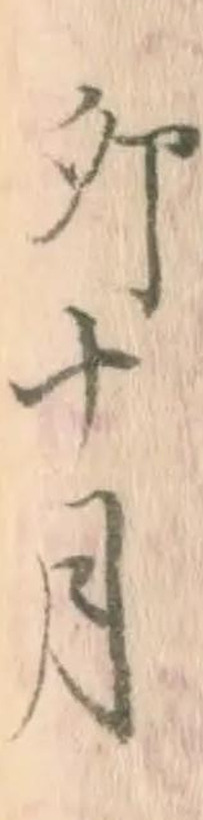卯十月
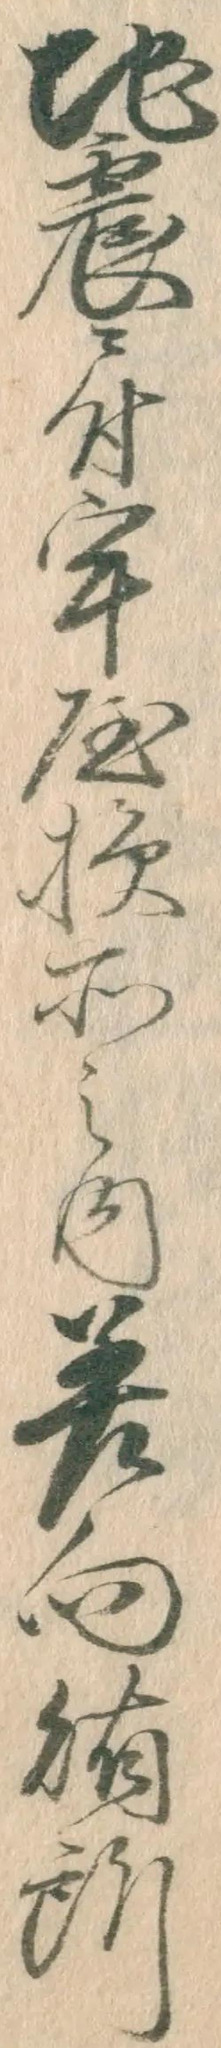地震ニ付牢屋敷損所之内差向賄所
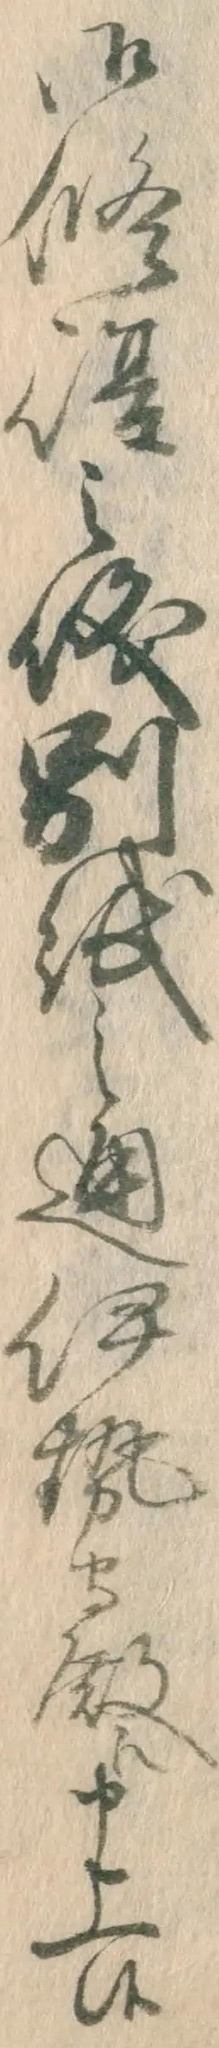御修復之儀別紙之通伊㔟守殿へ申上候

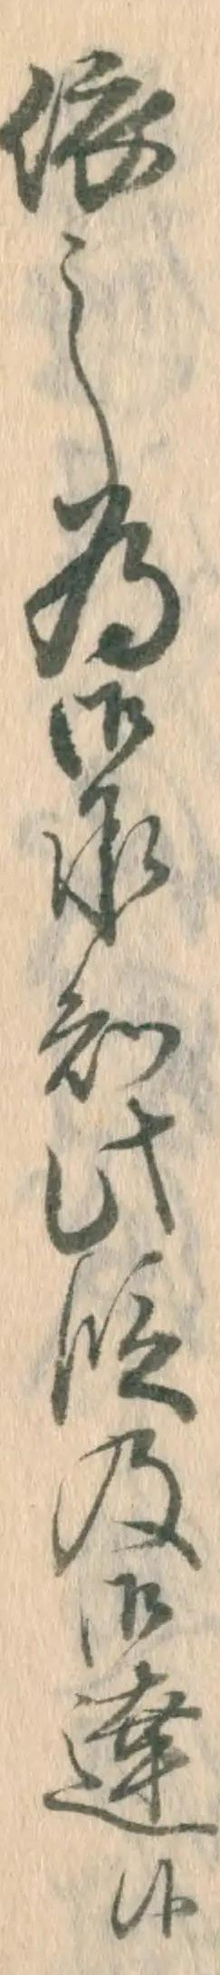依之為御承知此段及御達候
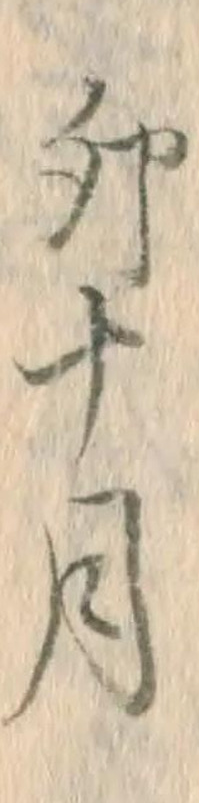卯十月
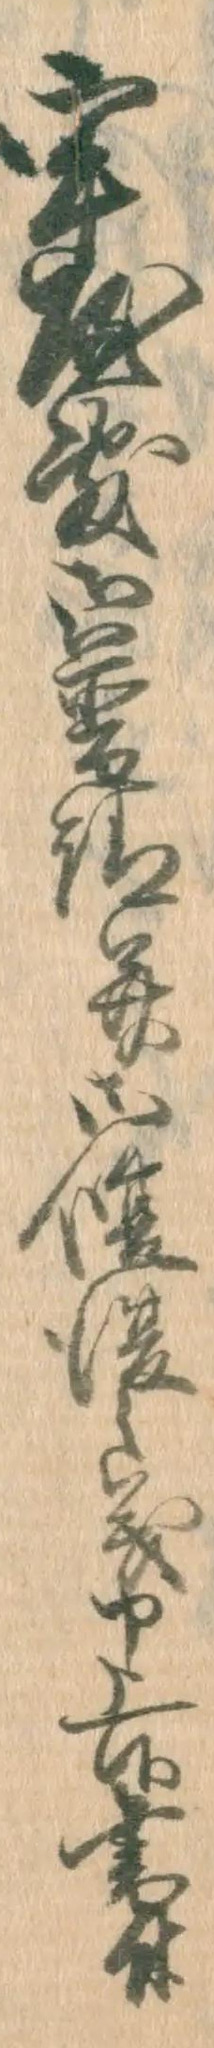│牢屋敷御普請幷御修復之義申上候書付
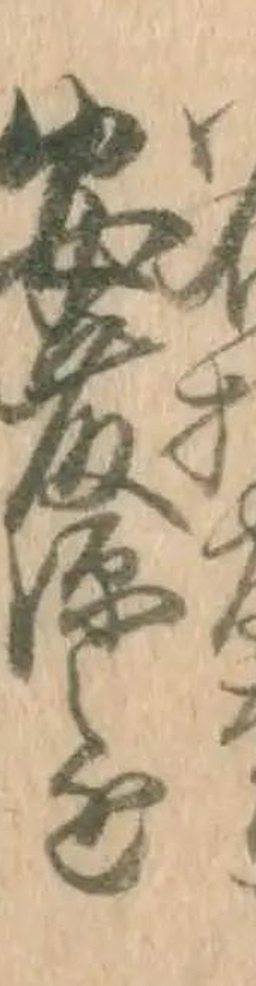│安藤源之進
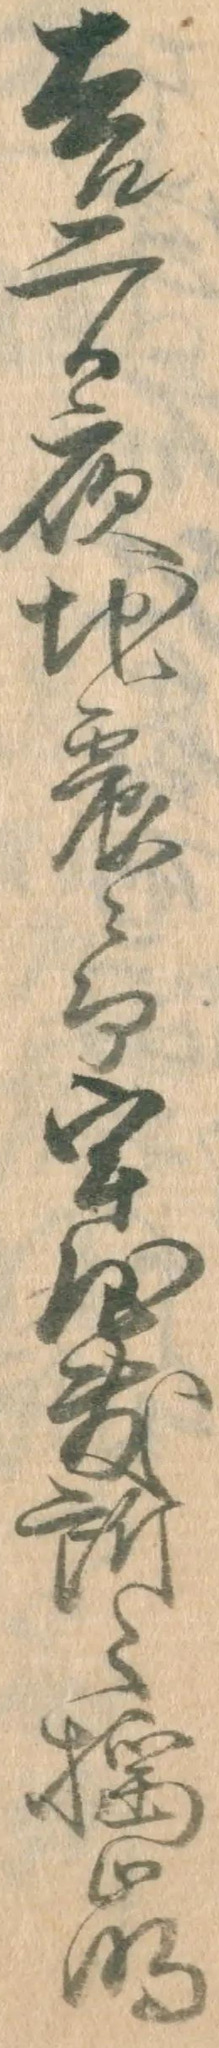去ル二日夜地震ニ而牢屋敷所〻揺崩
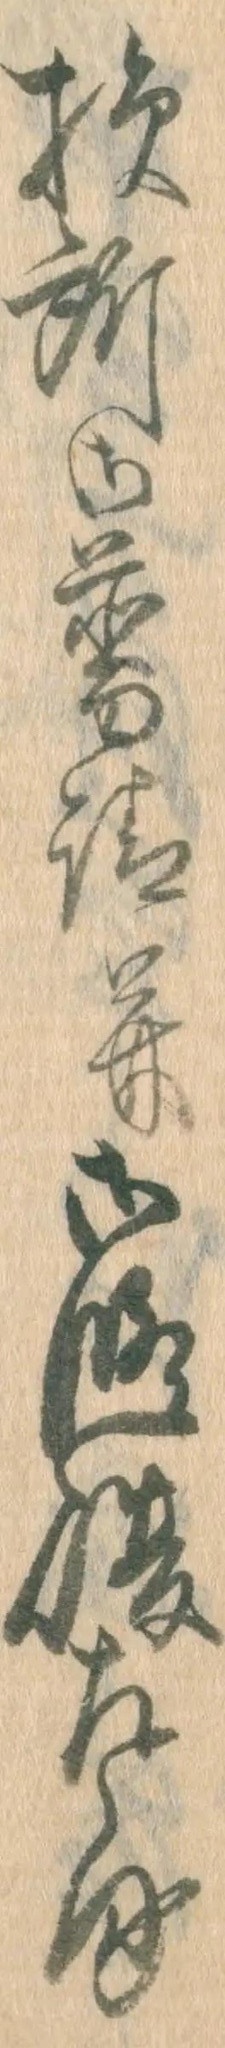損所御普請幷御修復左之通
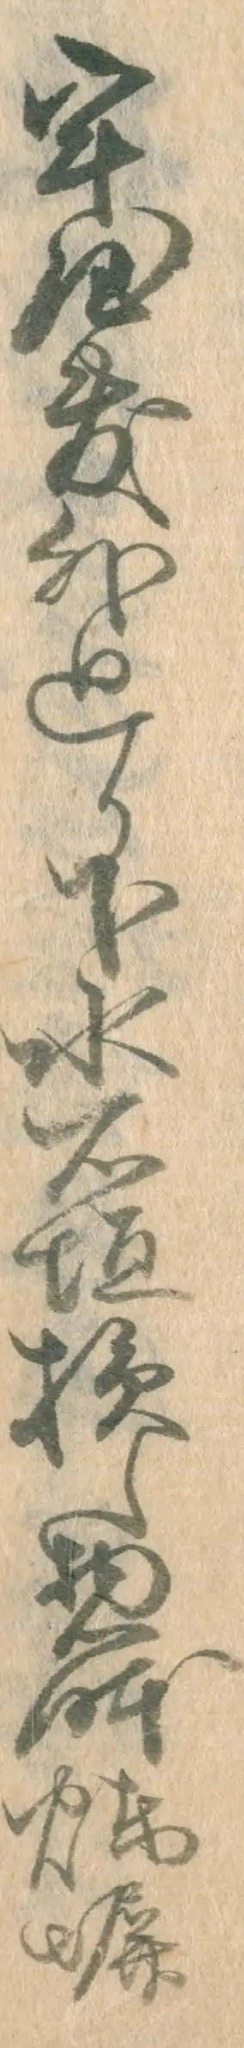一牢屋敷外廻り下水石垣損候惣体煉塀

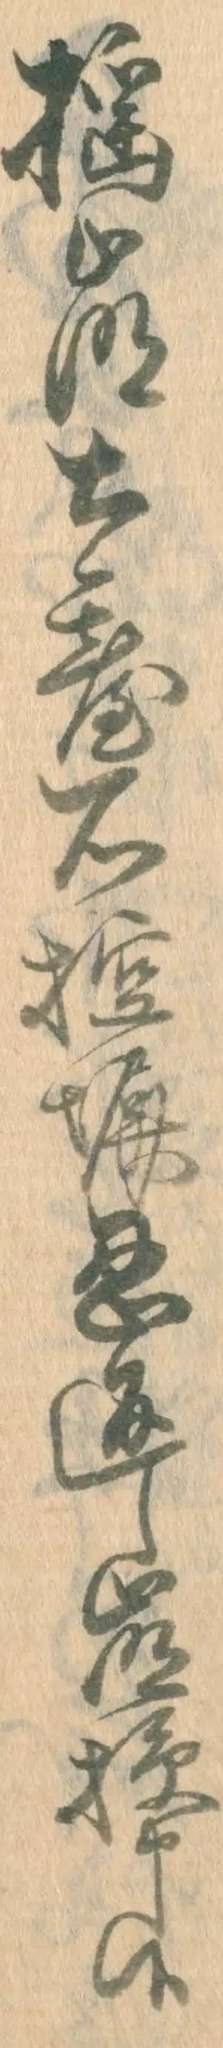揺崩土台石控塀忍返し崩損申候
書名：七十冊物類集 71巻. [44] 四十三 牢屋敷御普請御修覆地震ニ付骨折候牢屋掛御褒美之部
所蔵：国立国会図書館 National Diet Library, JAPAN
